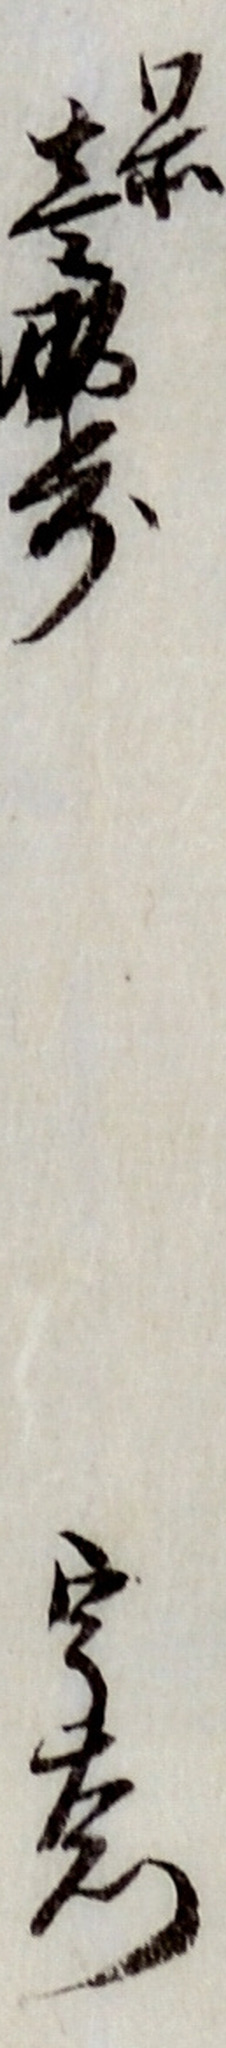壱畝歩宇右衛門
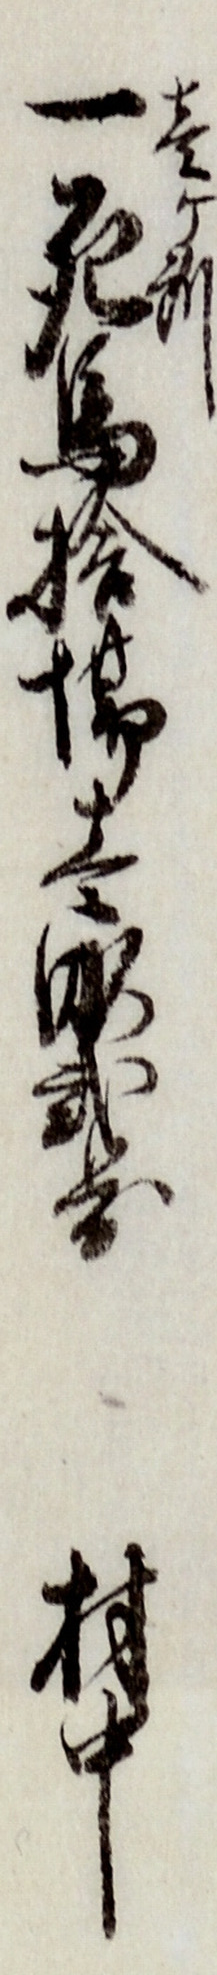一死馬捨場壱畝弐歩村中
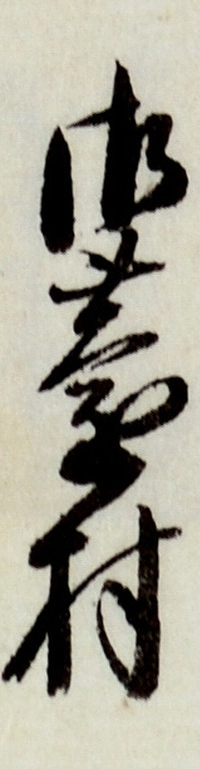御薗村
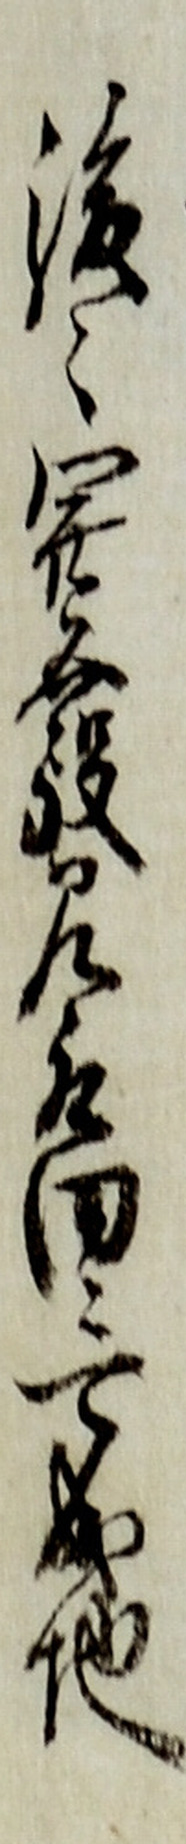後々開発見取田ニ可成地
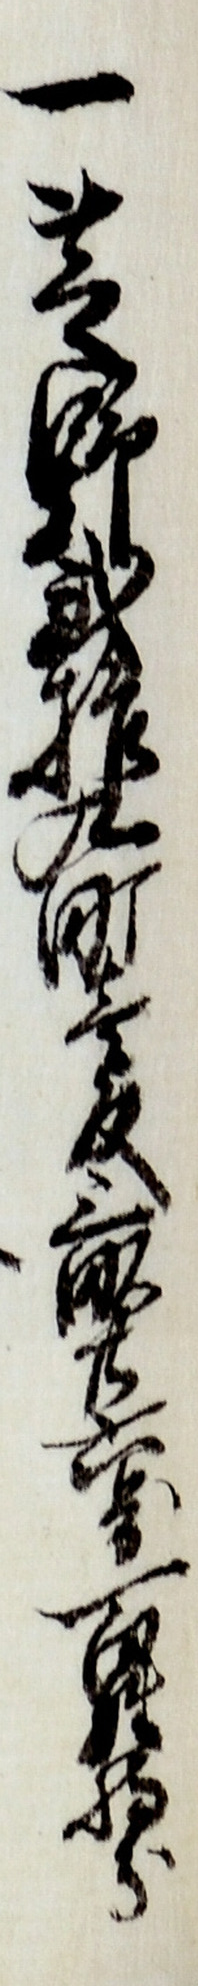一芝野弐拾九町壱反三畝廿六歩百姓持分
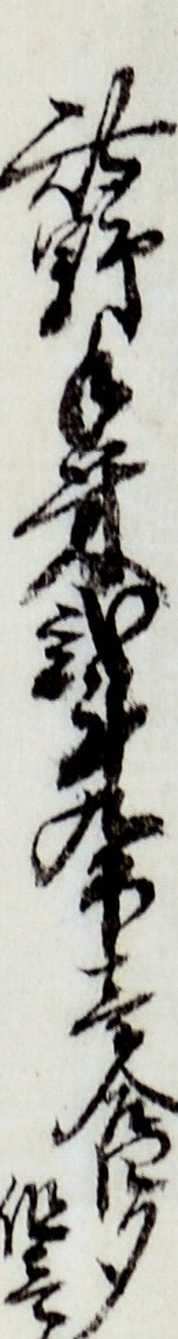此野手米弐斗九升壱合四勺
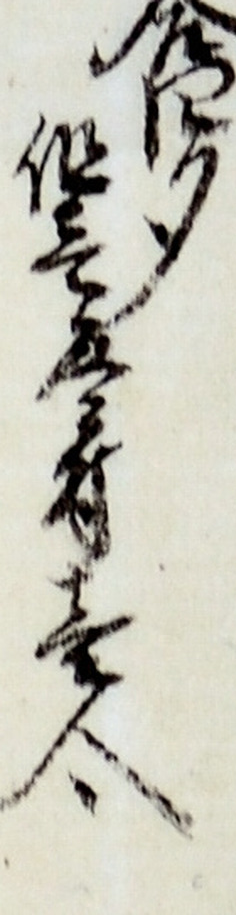但壱反ニ付壱合

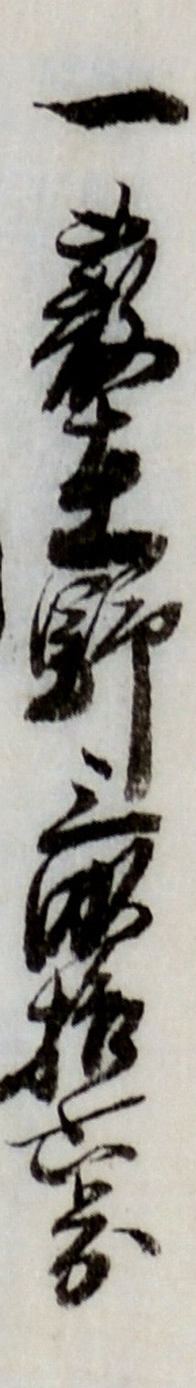一散在野三畝拾六歩
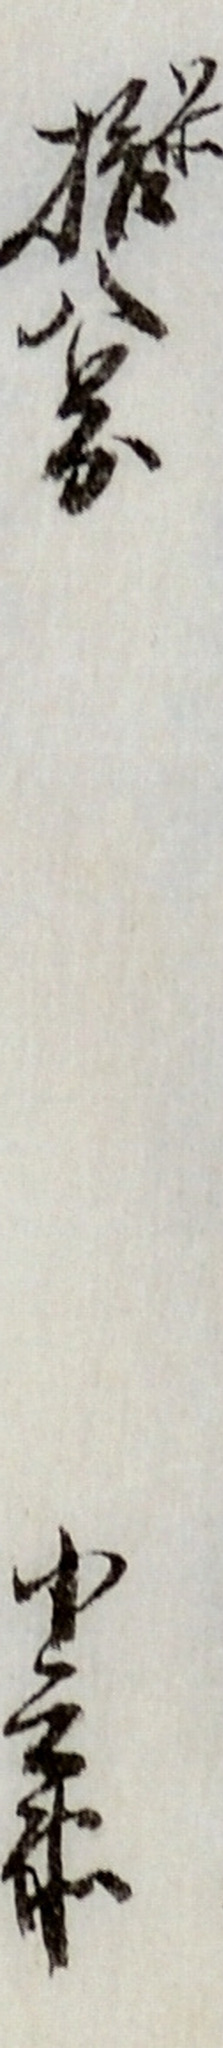拾八歩小兵衛
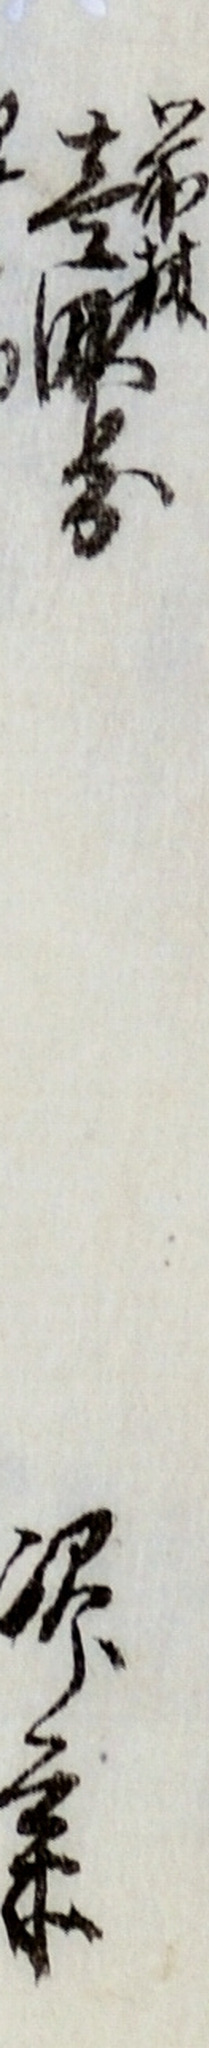壱畝歩次郎兵衛
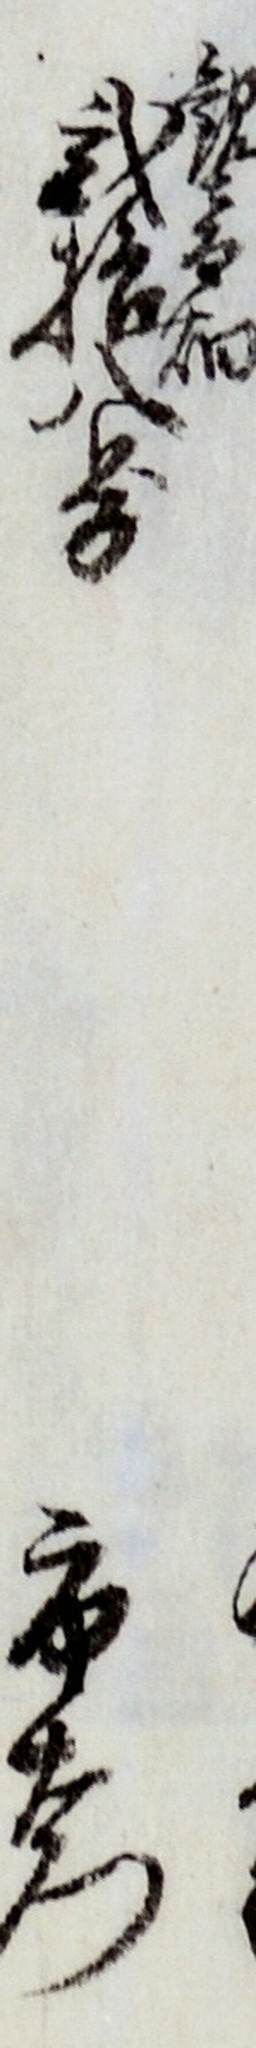弐拾八歩市右衛門
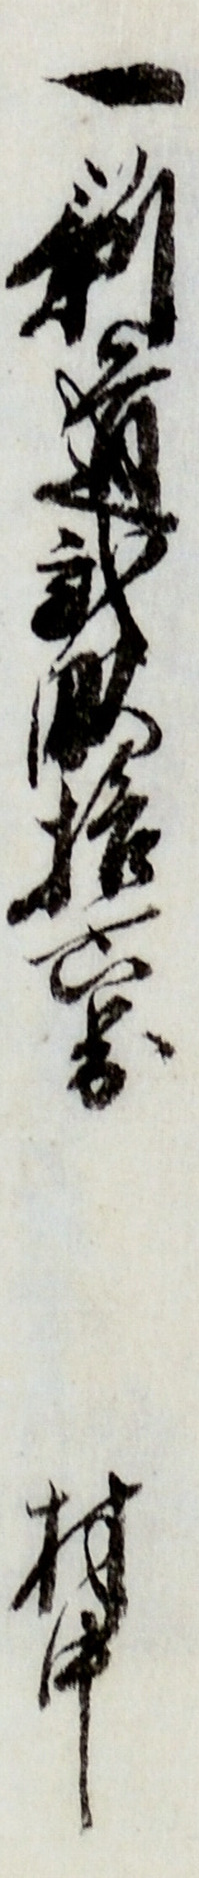一新道弐畝拾六歩村中
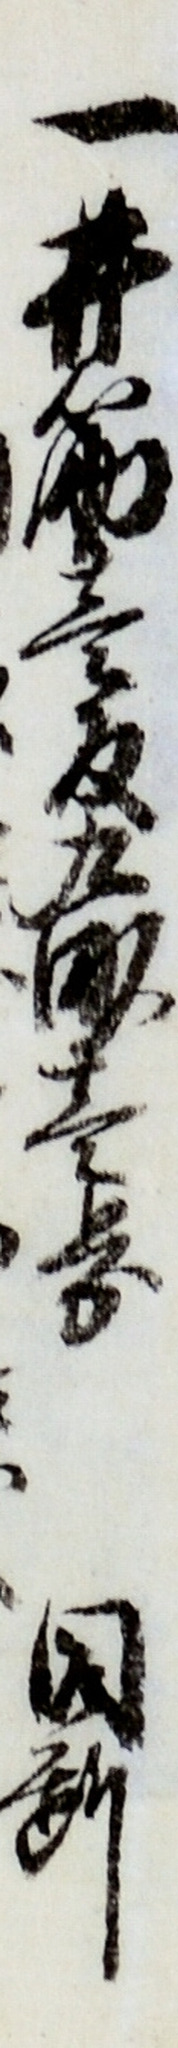一井筋壱反九畝壱歩同断
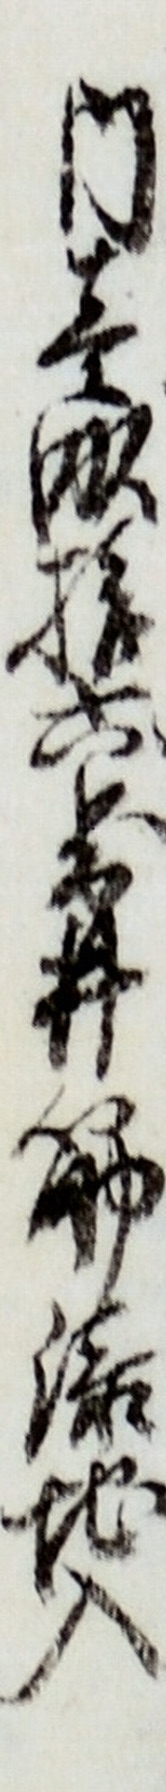内壱畝拾六歩井筋添地入
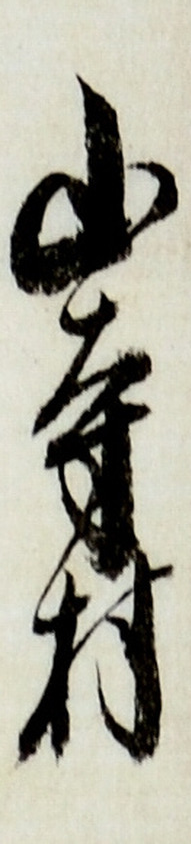山寺村
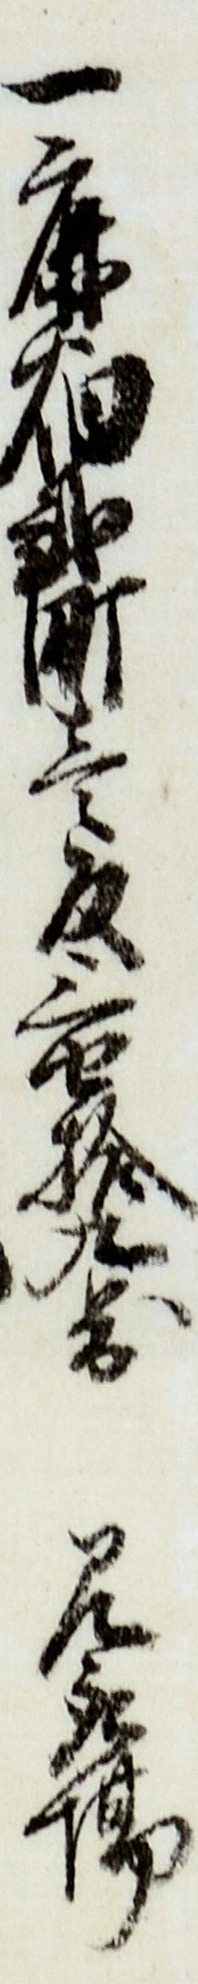一麻畑弐町壱反三セ拾九歩見取場
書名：御領分中山林社地手控
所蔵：伊那市立高遠町図書館・合同会社AMANE
